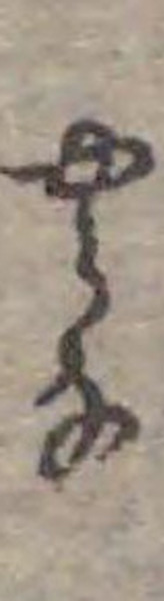やうな
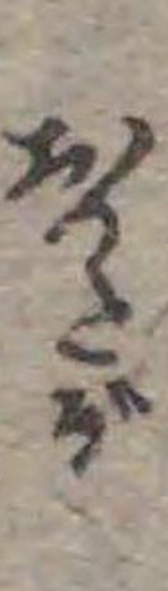おかたが
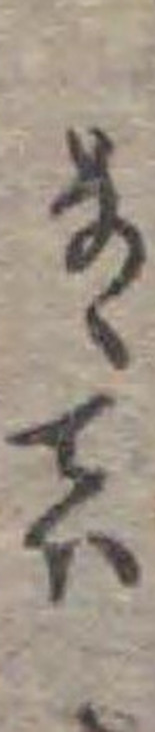なくては
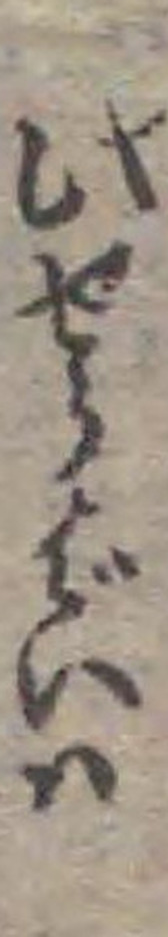此せうばいは
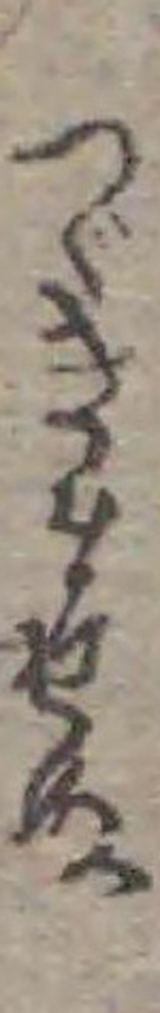つゞきませぬ
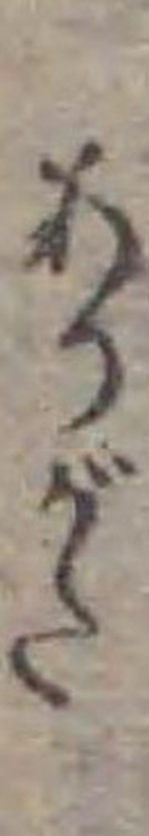ありがた

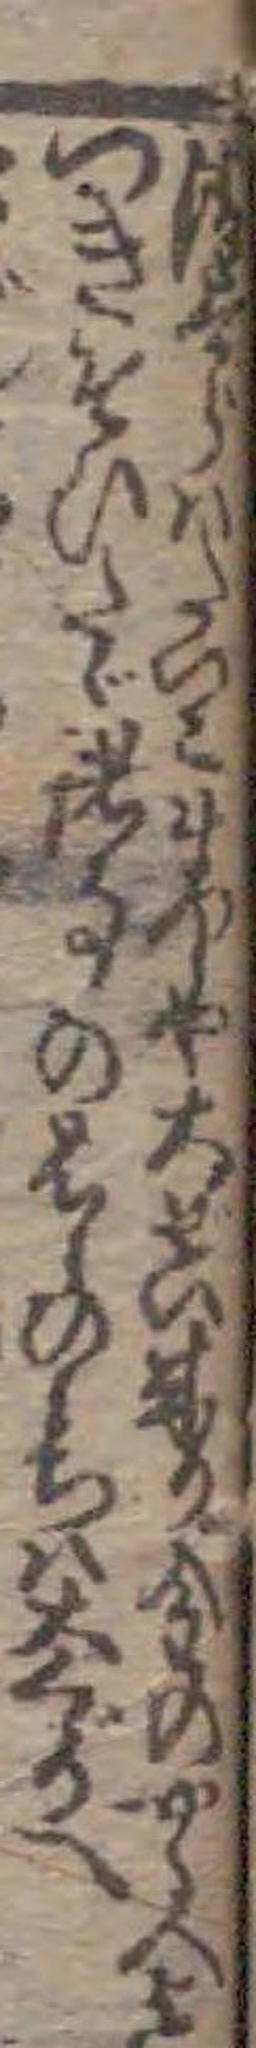つきそひたゞ諸事のはらひみちは大くゞりへ
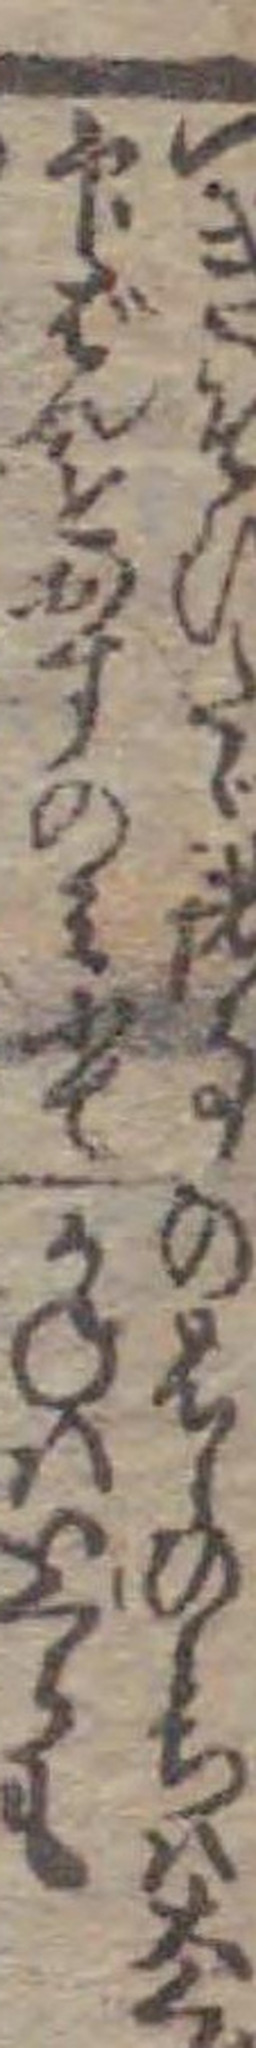印ばんをおすのみにて
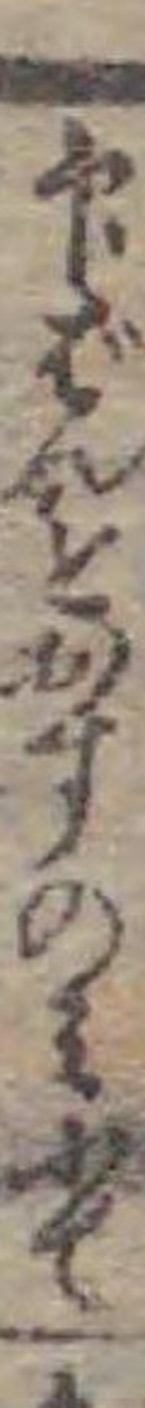印ばんをおすのみにて
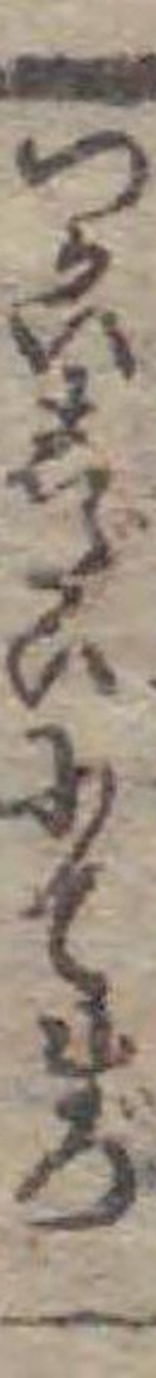つかいしだいにてまづ
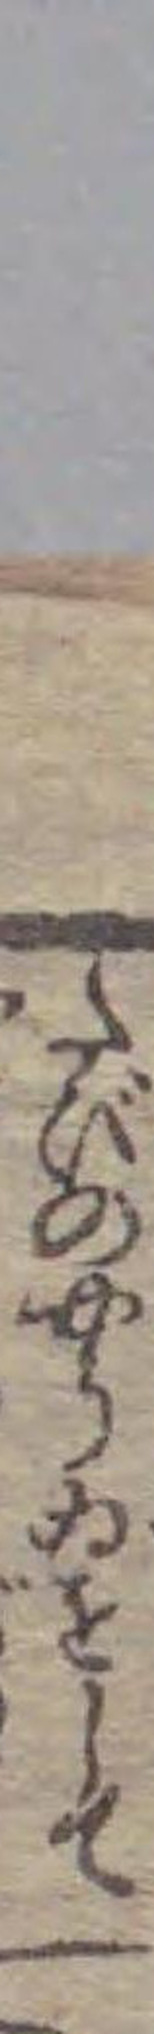たびのやうゐをして
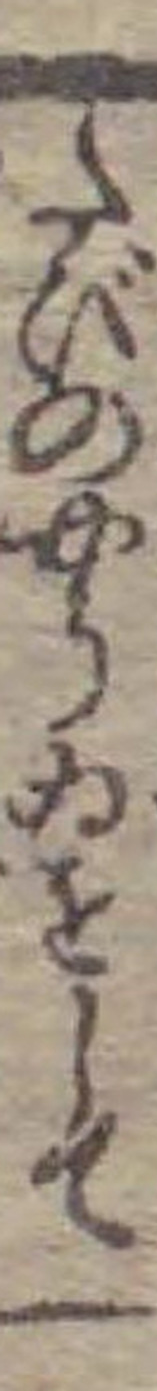たびのやうゐをして
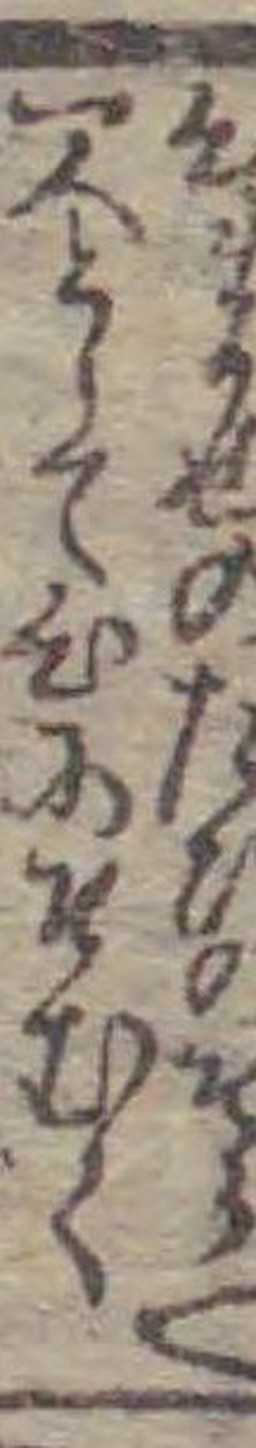一人として心にそむく
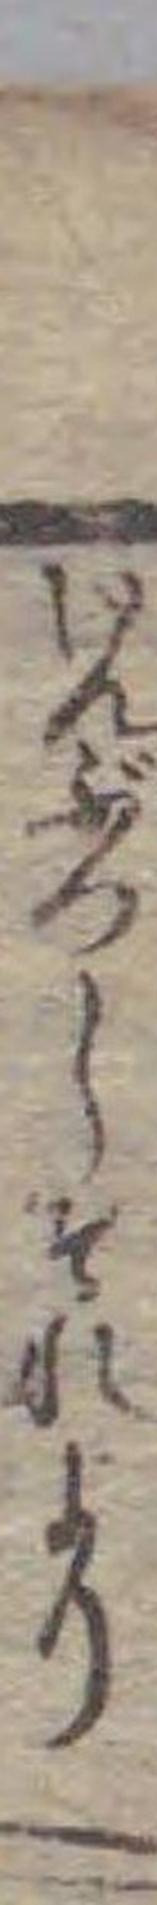けんぶつしそれより
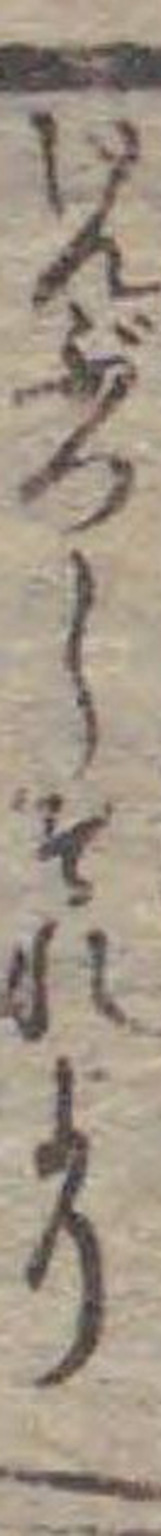けんぶつしそれより
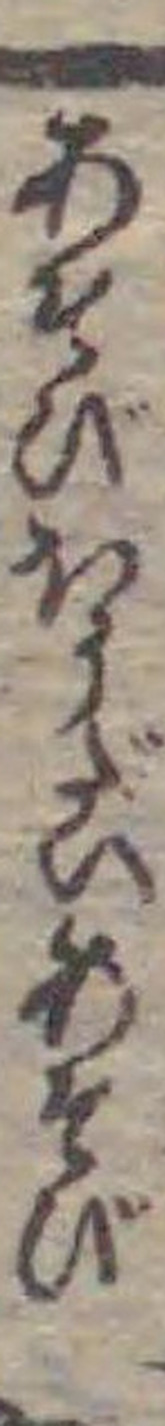あそびほうだいあそび
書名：見徳一炊夢 : 3巻
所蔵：国立国会図書館 National Diet Library, JAPAN
